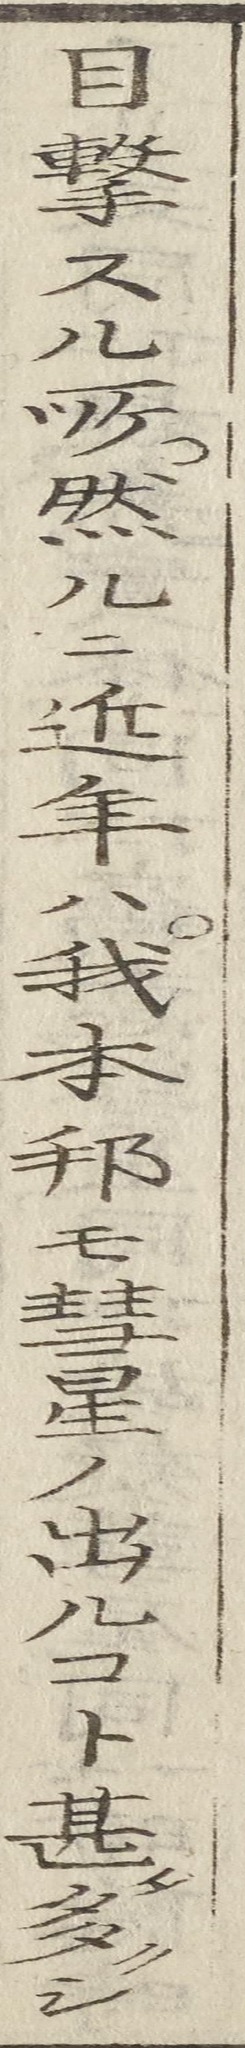目撃スル所。然ルニ近年ハ。我本邦モ彗星ノ出ルコト甚多
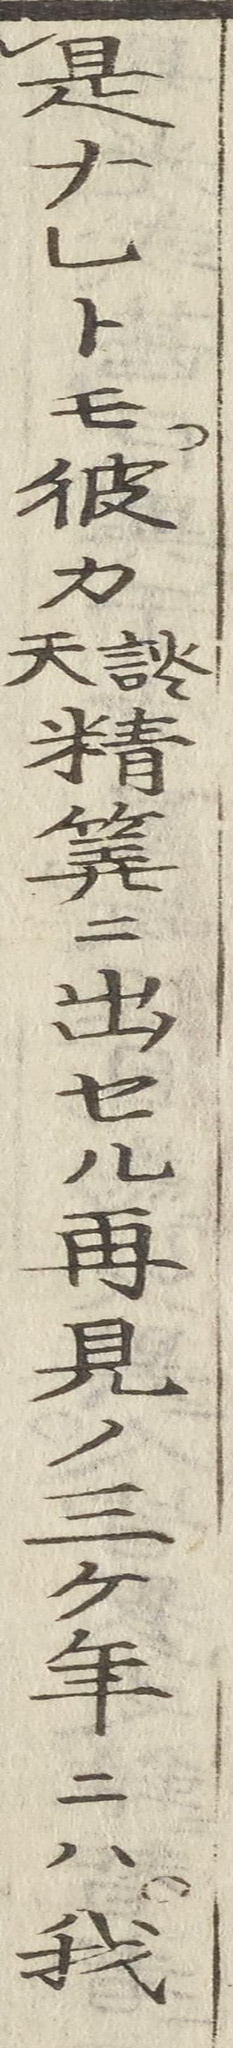是ナレトモ。彼カ談天精算ニ出セル再見ノ三ヶ年ニハ。我
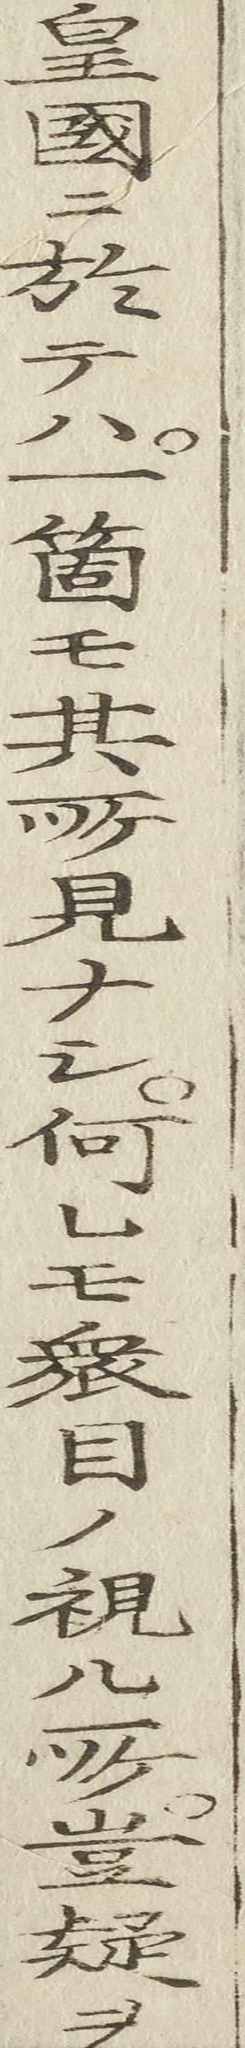皇国ニ於テハ。一箇モ其所見ナシ。何レモ衆目ノ視ル所。豈疑ヲ
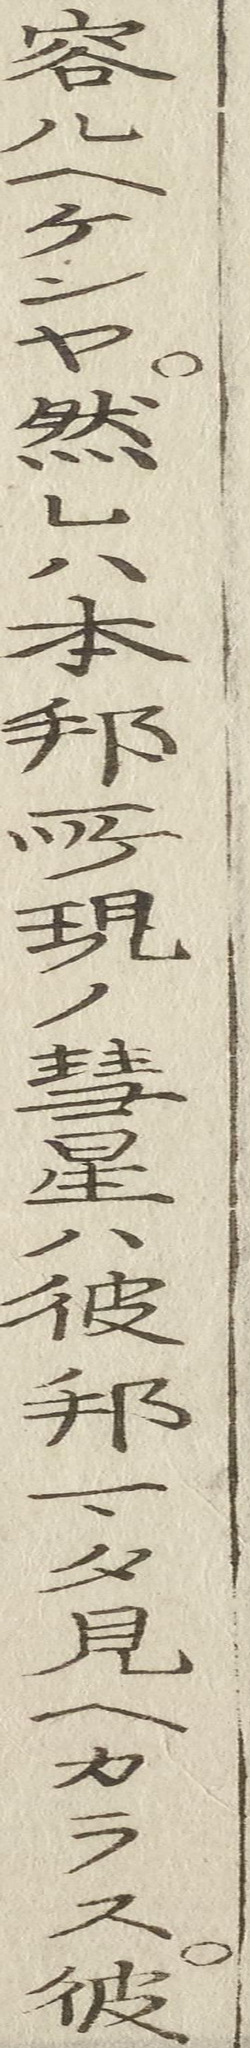容ルヘケンヤ。然レハ本邦所現ノ彗星ハ彼邦マタ見ヘカラス。彼
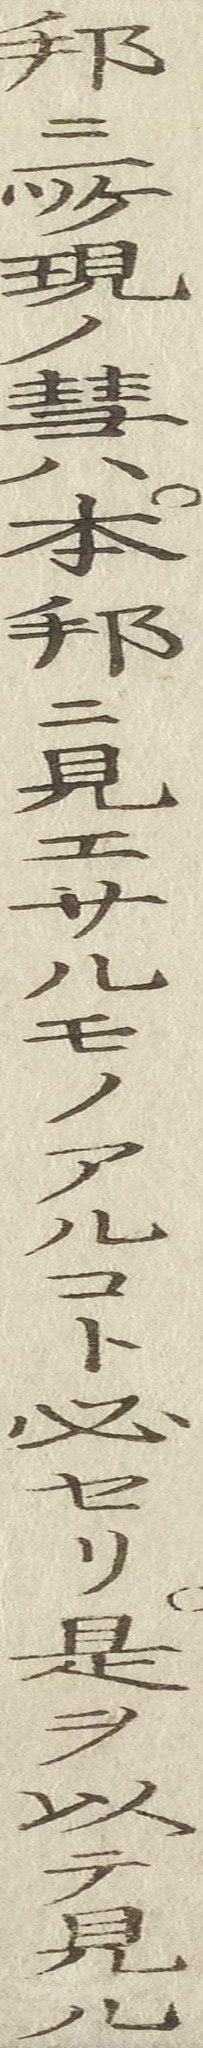邦ニ所現ノ彗ハ。本邦ニ見エサルモノアルコト必セリ。是ヲ以テ見ル
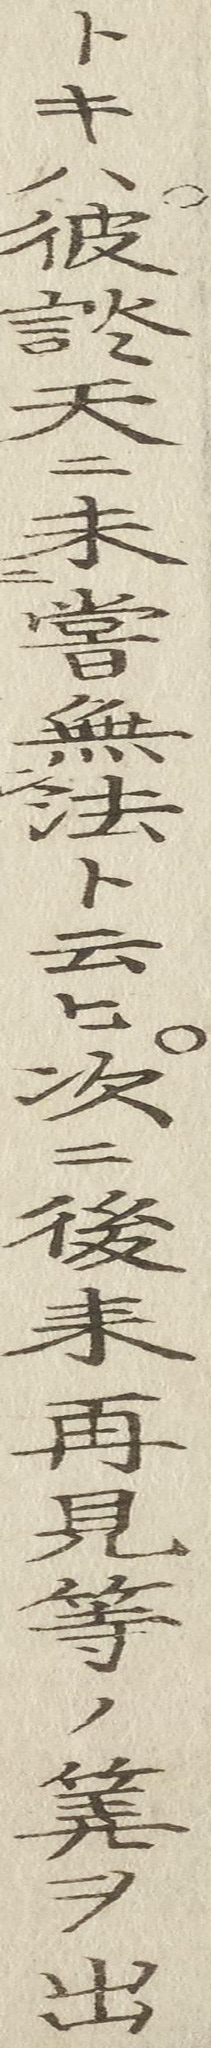トキハ。彼談天ニ未嘗無法ト云ヒ。次ニ後来再見等ノ算ヲ出
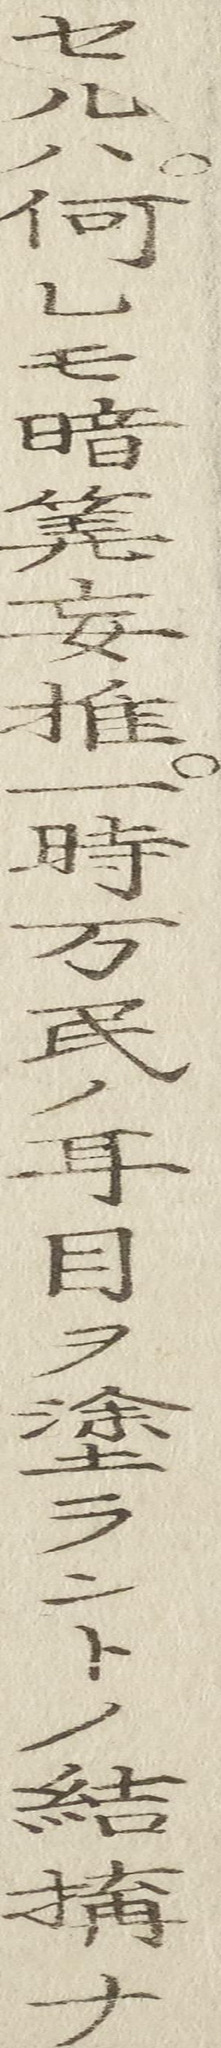セルハ。何レモ暗算妄推。一時万民ノ耳目ヲ塗ラントノ結堉？ナ
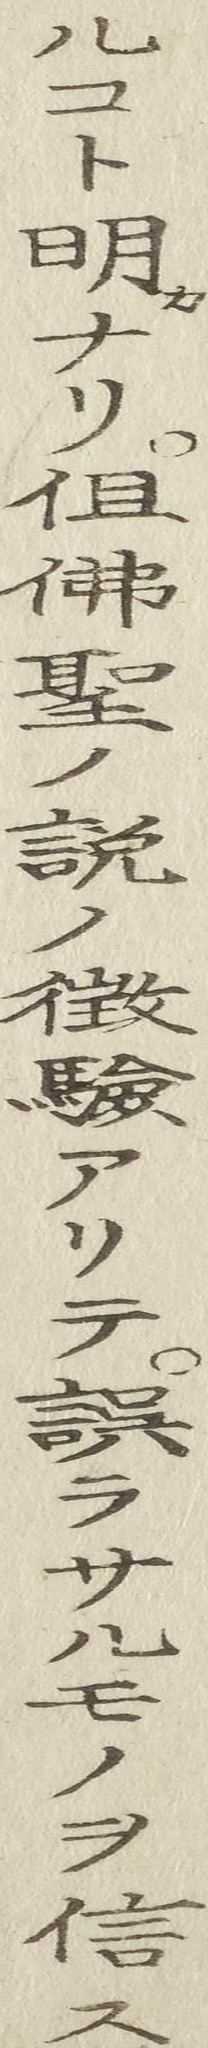ルコト明。但仏聖ノ説ノ徴験アリテ。誤ラサルモノヲ信ス
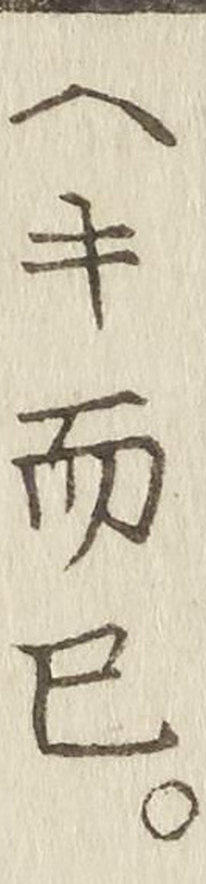ヘキ而已。
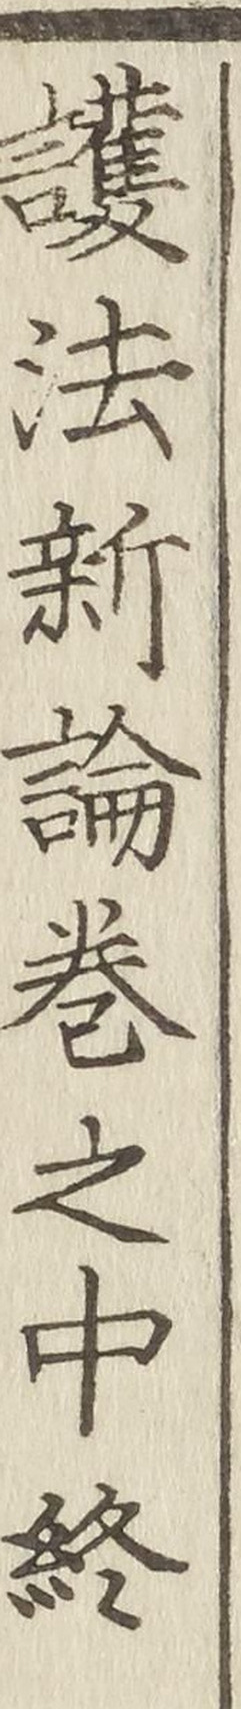護法新論巻之中終
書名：護法新論　中
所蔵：東京大学地震研究所図書室 Earthquake Research Institute Library, The University of Tokyo, JAPAN
